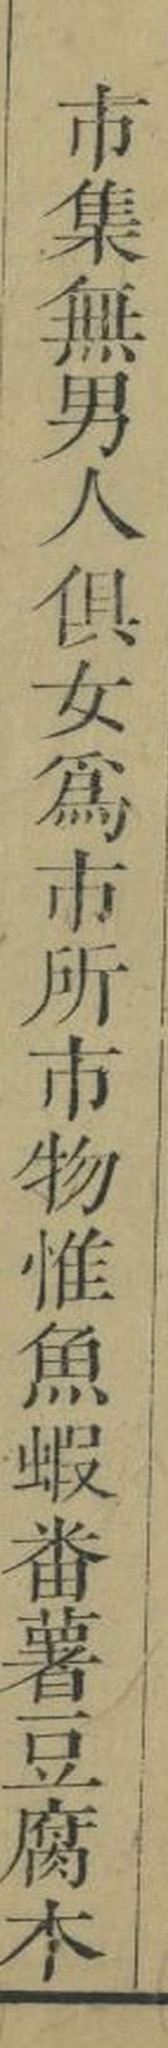市集無男人俱女為市所市物惟魚蝦畨薯豆腐木
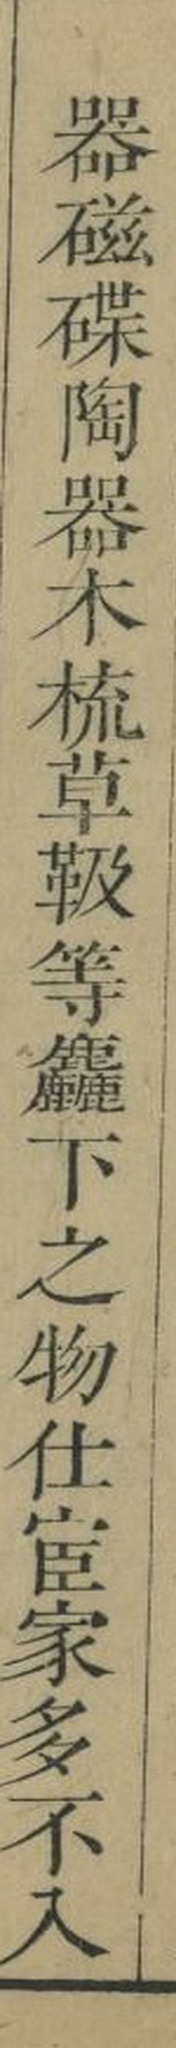器磁碟陶器木梳草靸等麤下之物仕宦家多不入
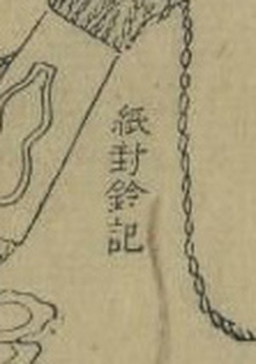紙封鈴記

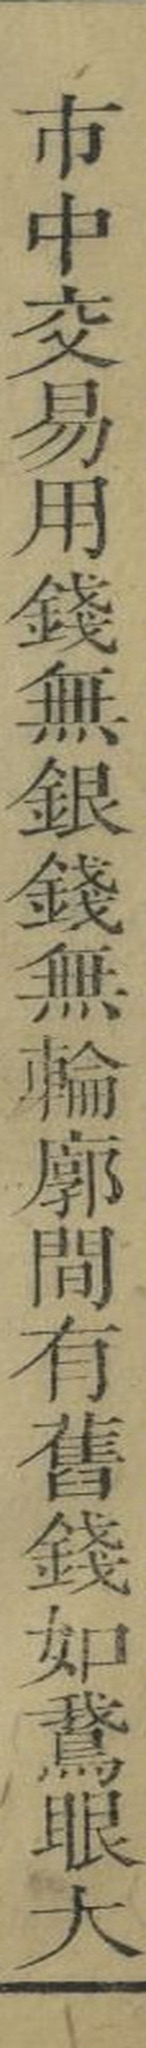市中交易用銭無銀銭無輪廓間有旧銭如鵞眼大
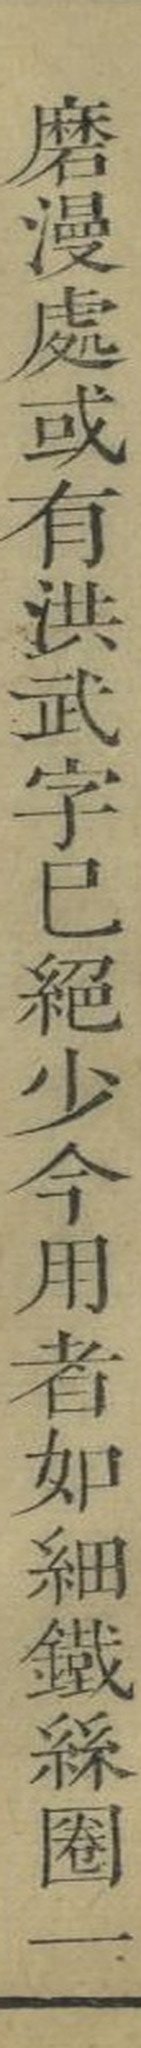磨漫処或有洪武字巳絶少今用者如細鉄糸圏一
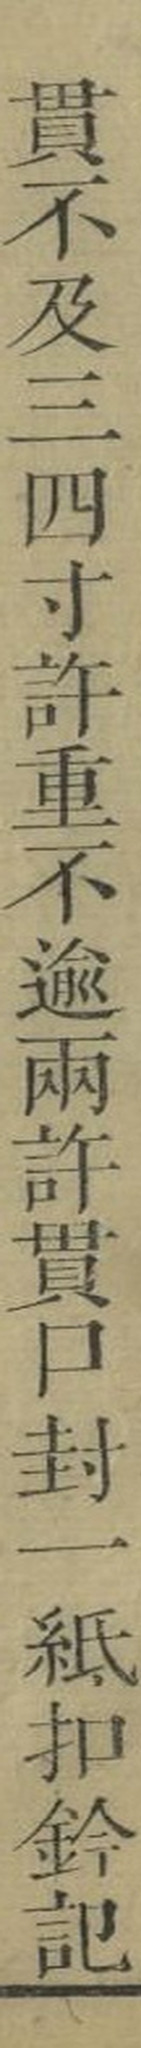貫不及三四寸許重不逾両許貫口封一紙扣鈴記
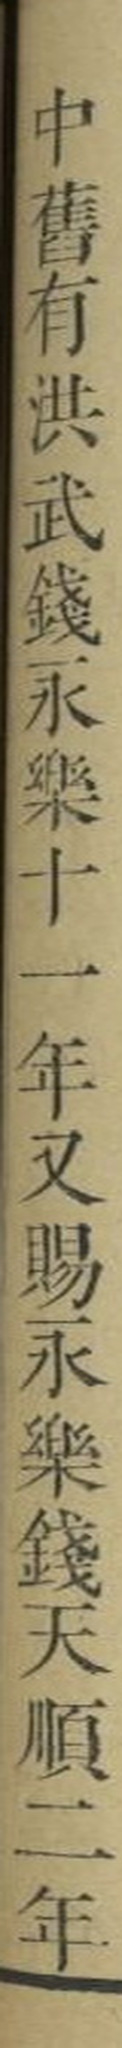中旧有洪武銭永楽十一年又賜永楽銭天順二年
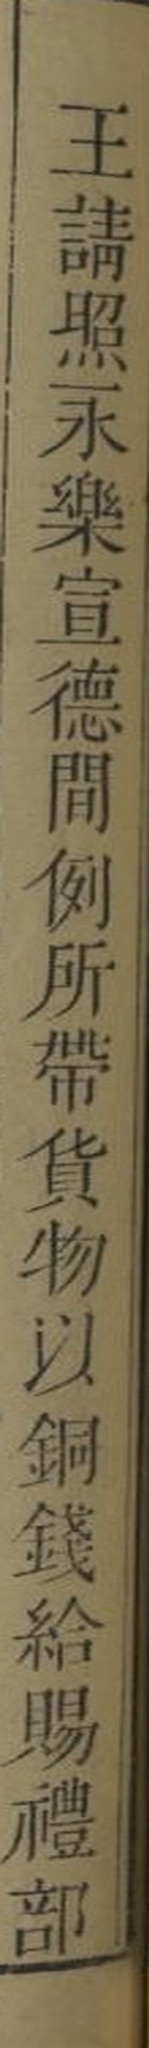王請照永楽宣徳間例所帯貨物以銅銭給賜礼部
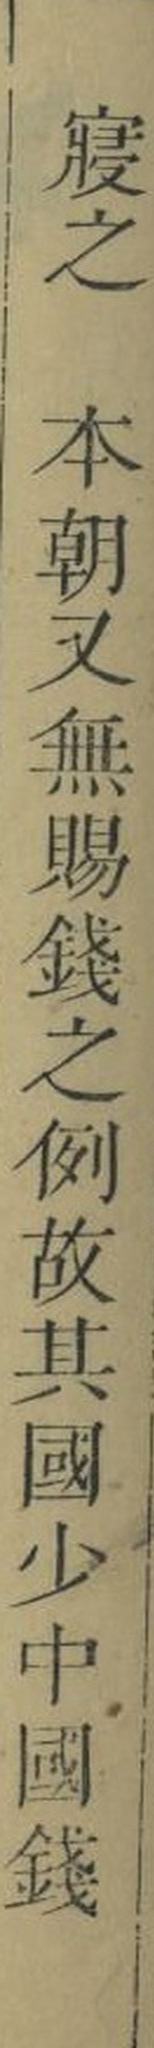寝之本朝又無賜銭之例故其国少中国銭
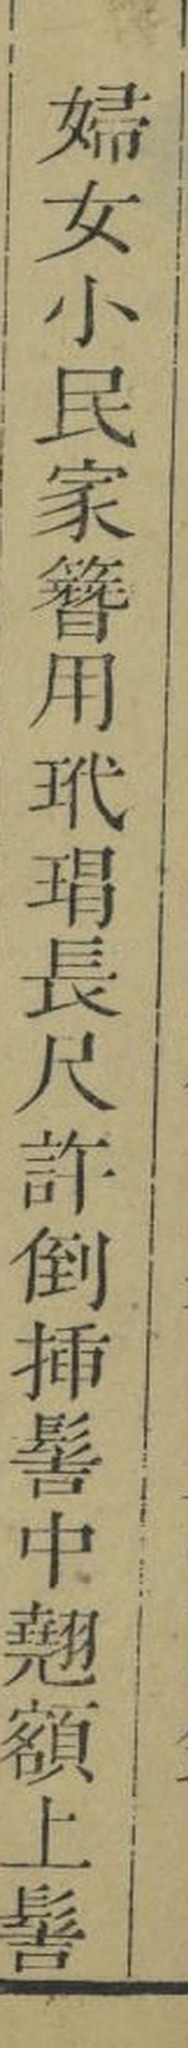婦女小民家簪用玳瑁長尺許倒揷髻中翹額上髻
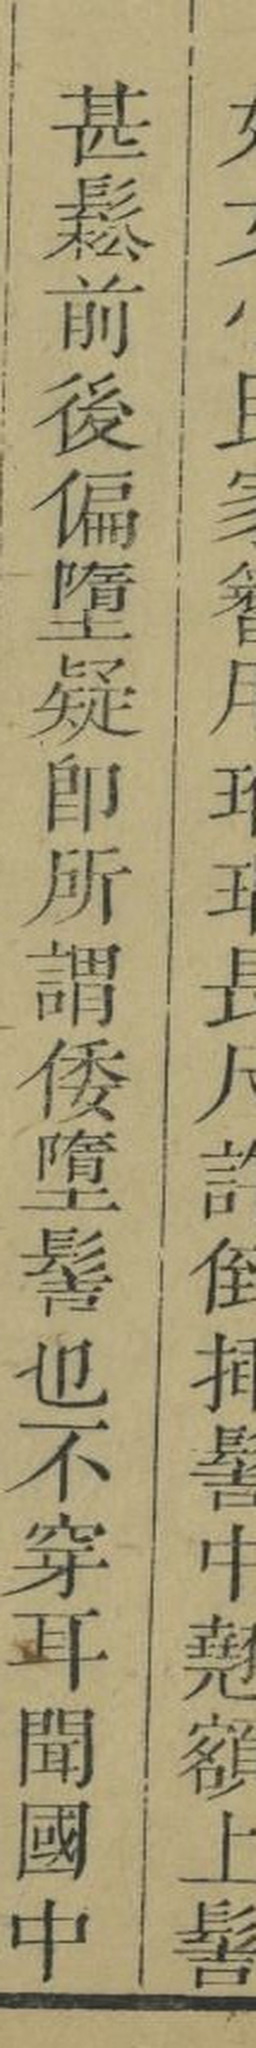甚鬆前後偏堕疑即所謂倭堕髻也不穿耳聞国中
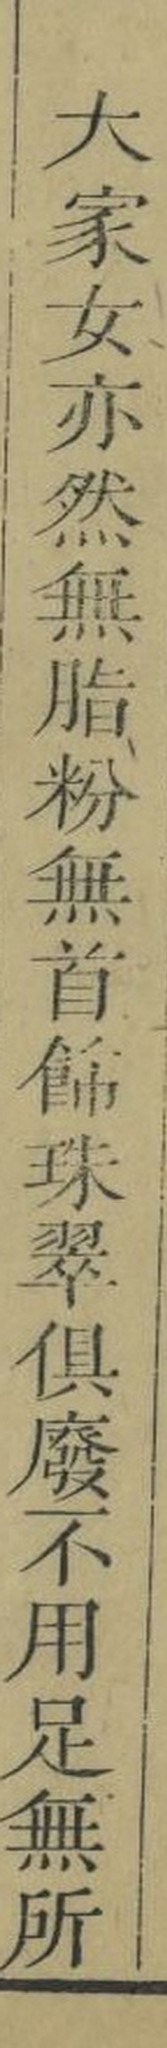大家女亦然無脂粉無首飾珠翠倶廃不用足無所
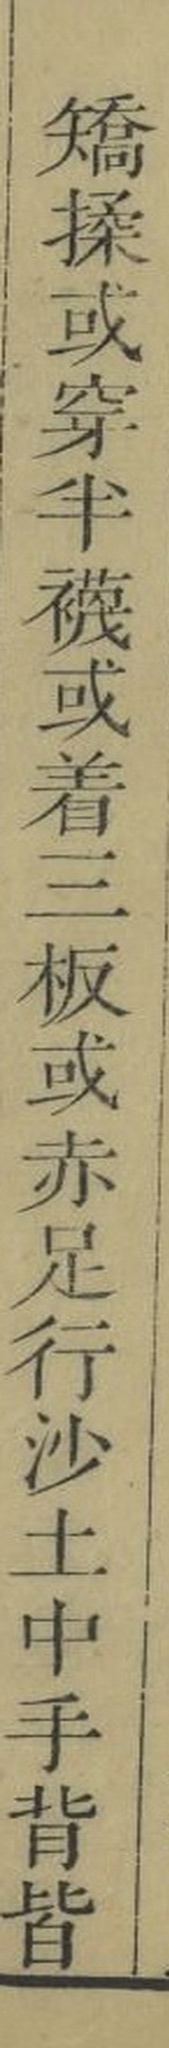矯揉或穿半襪或着三板或赤足行沙土中手背皆
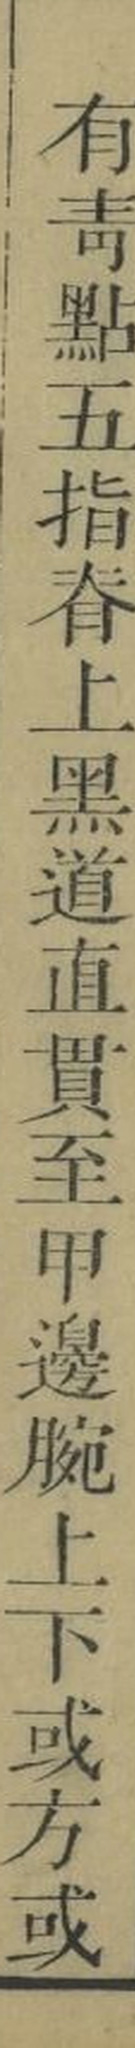有青点五指脊上黒道直貫至甲辺腕上下或方或
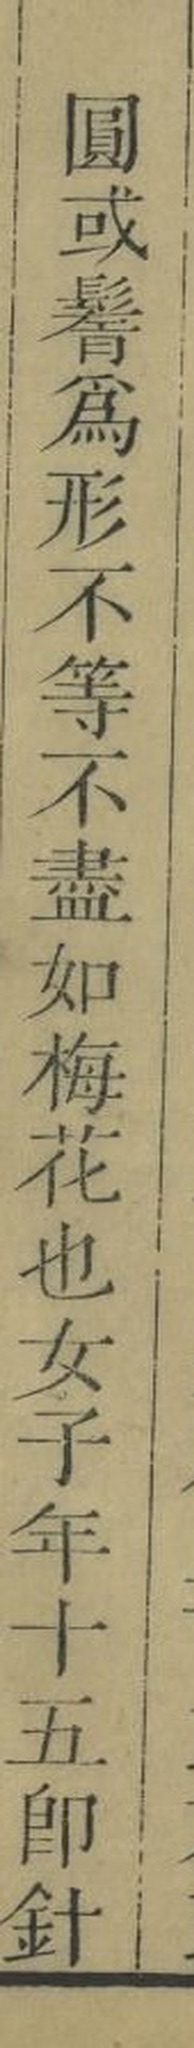円或鬌為形不等不尽如梅花也女子年十五即針
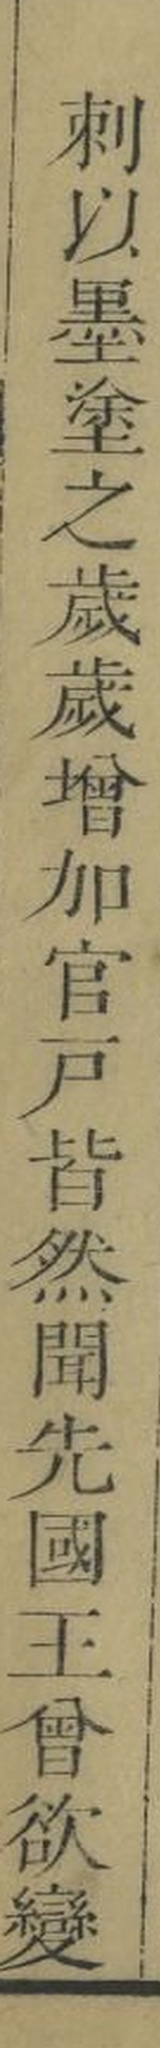刺以墨塗之歳歳増加官戸皆然聞先国王曽欲変
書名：中山伝信録 巻六
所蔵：University of the Ryukyus Library
